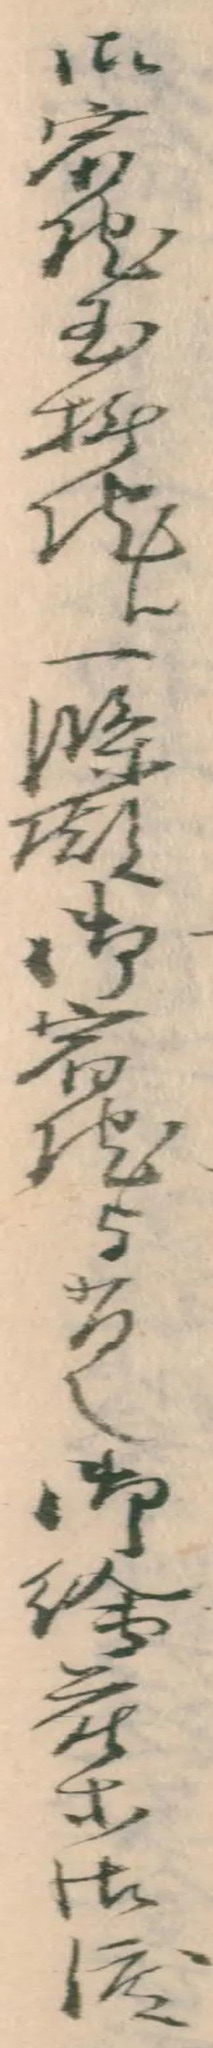御宿院玉柳院え一條殿御宿院と有之御繪ニ付等御渡
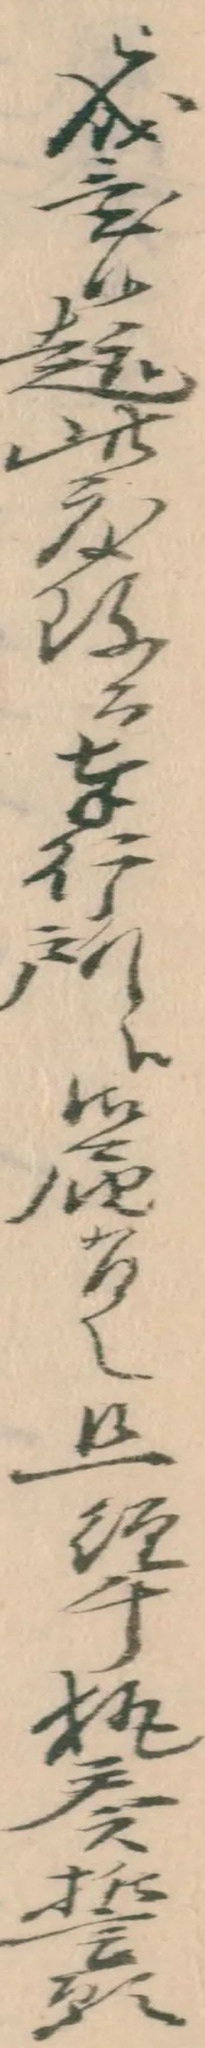被成置候趣此度改而奉行所え御届有之且経千執奏誓願
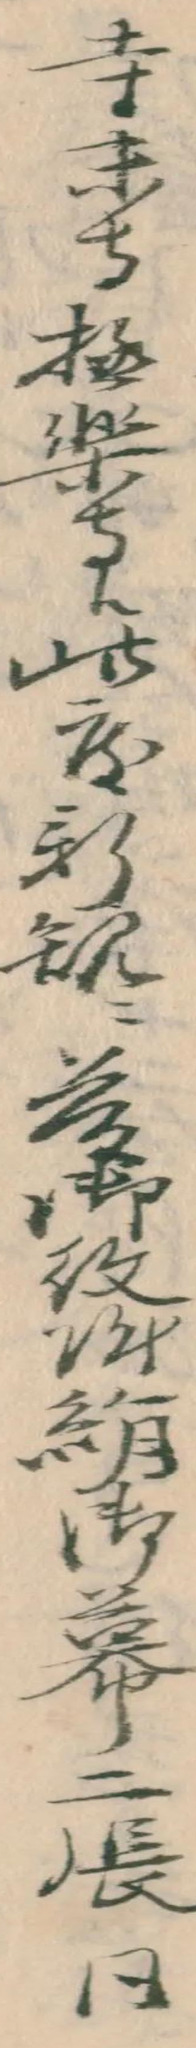寺末寺極楽寺え此度新規ニ藤御紋附絹御幕二張同
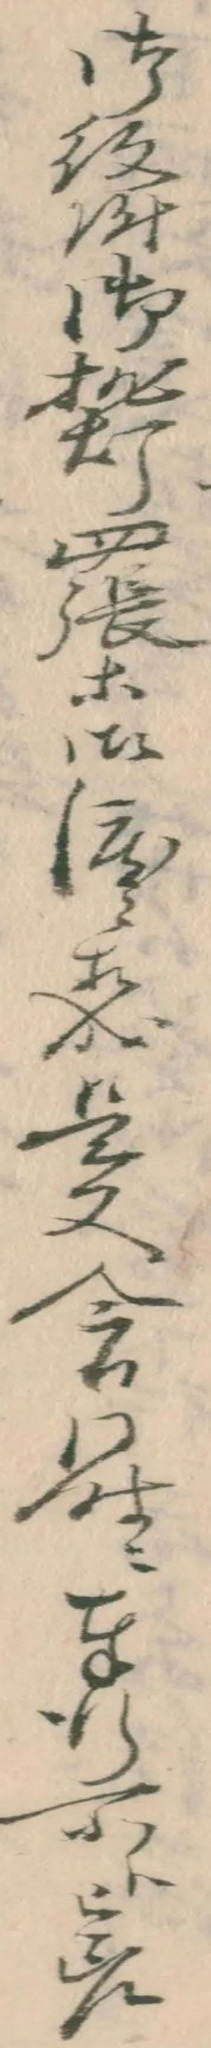御紋附御挑灯四張等御渡二相成是又今日同時に奉行所え被差
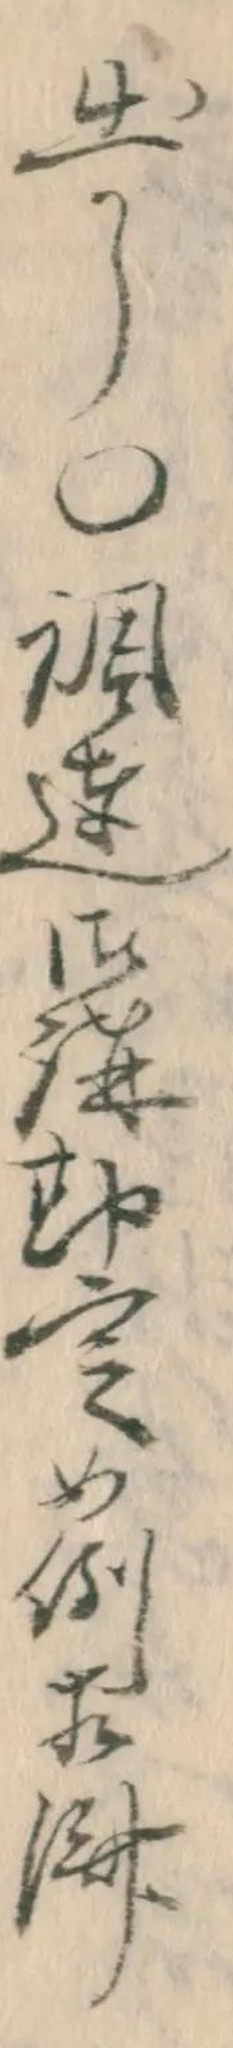出了○調達御講勘定如例相済
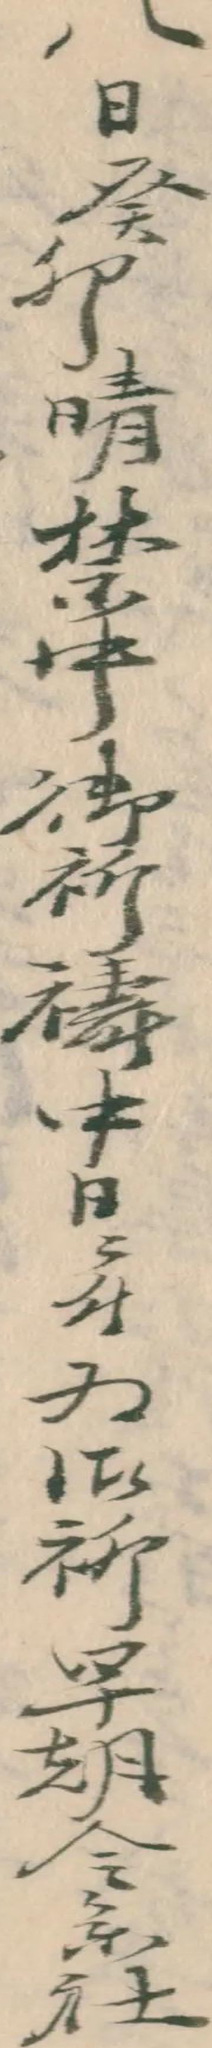八日癸卯晴禁中御祈祷中日ニ付為御祈早朝令参社
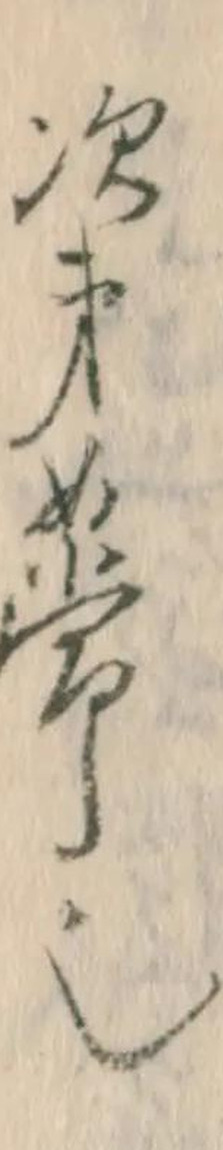次第如当也
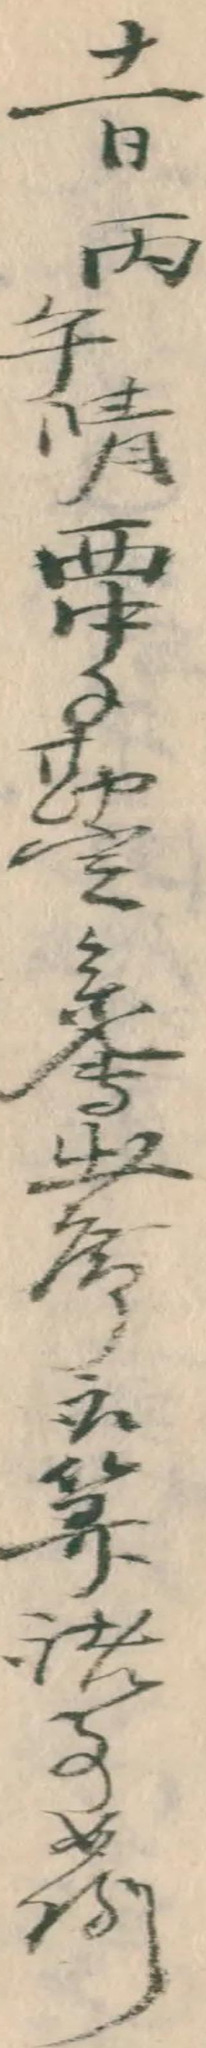十一日丙午晴西中手勘定参会出席取算諸事如例
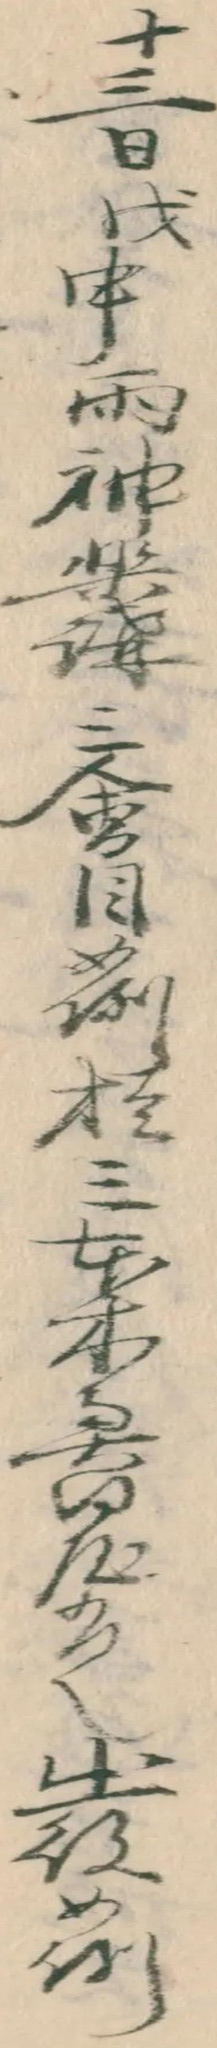十三日戊申雨神楽講三會目如例於三本木奥田屋有之出役如例
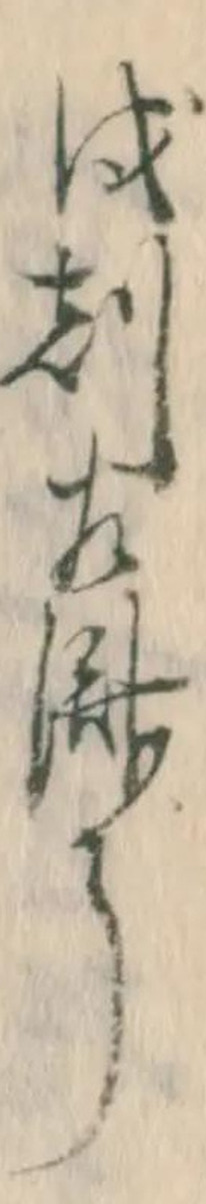戌刻相済了
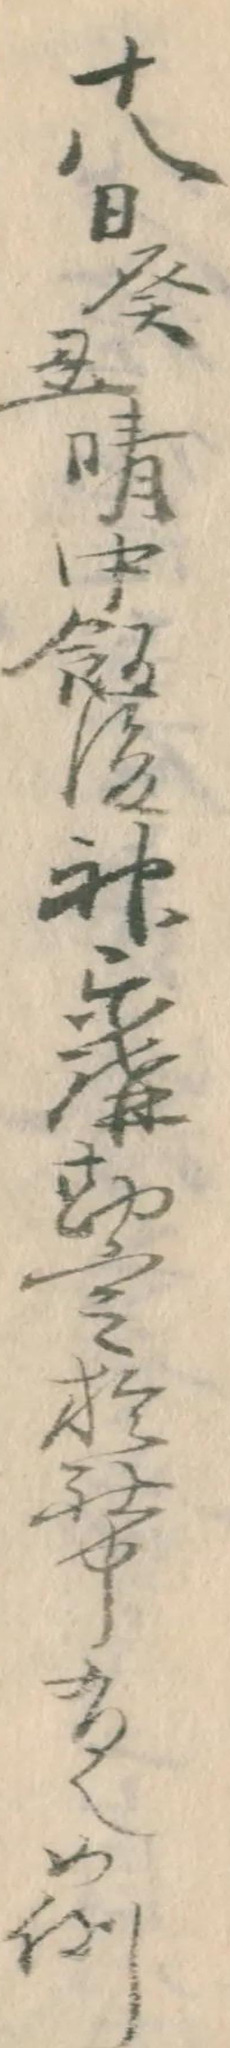十八日癸丑晴中飯後神楽講勘定於社中有之如例
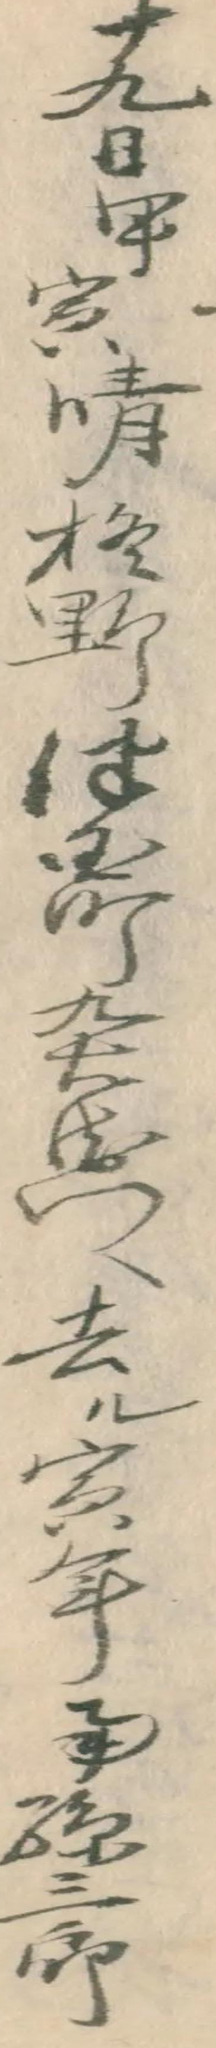十九日甲寅晴柊野津国町九右衛門へ去ル寅年南孫三郎
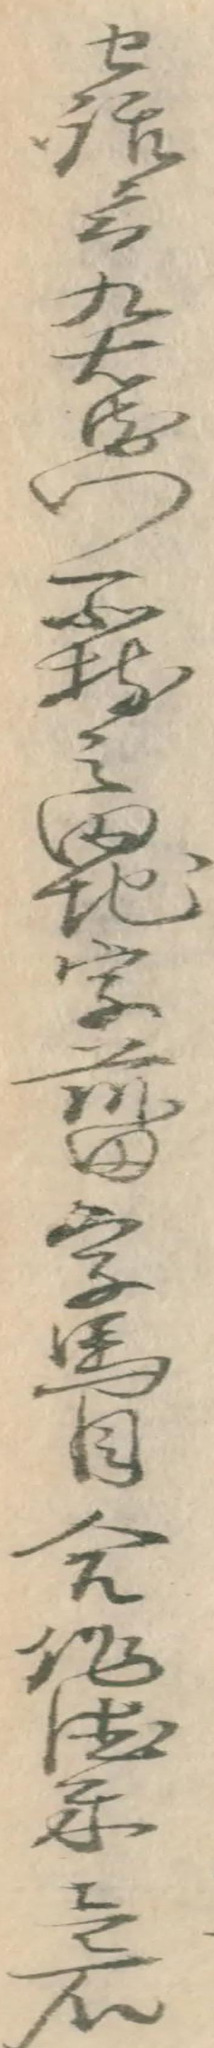世話二而九右衛門所持之田地字前田字馬目合作徳米壱石

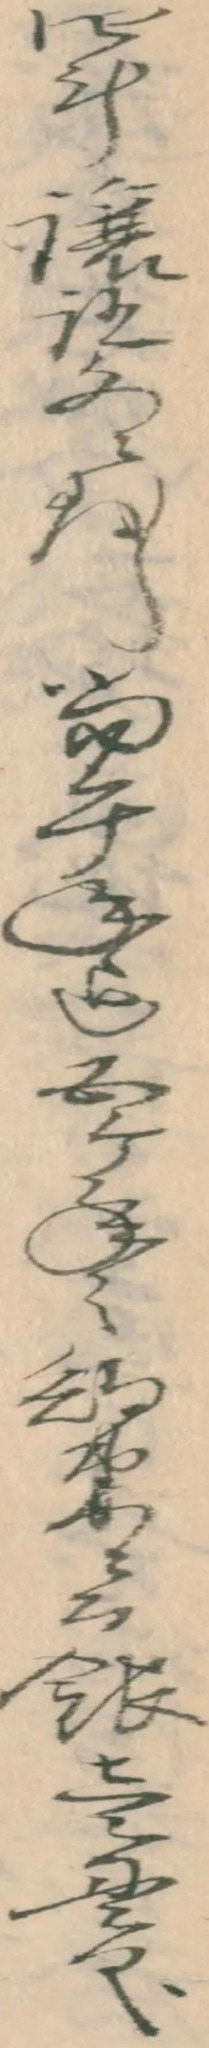四斗譲請文に致し當午年迄五ヶ年之約束ニ而銀壱貫匁
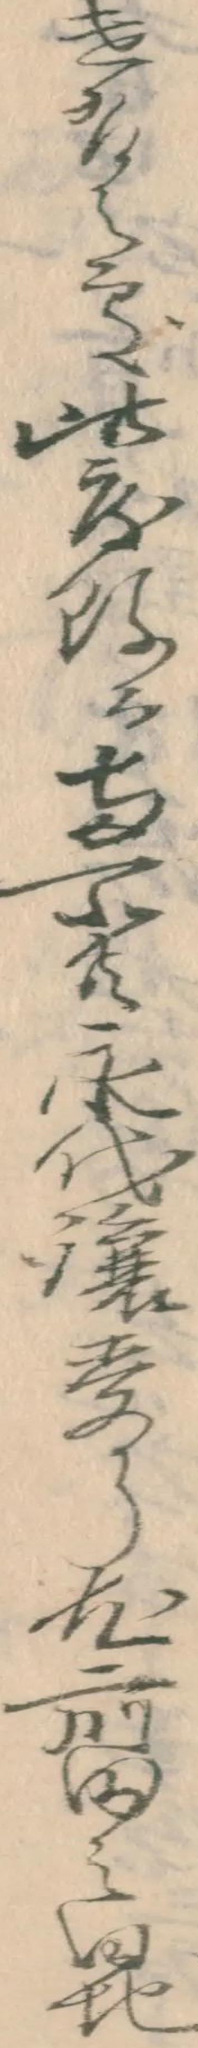遣有之處此度改而両所共永代譲受了尤前田之田地
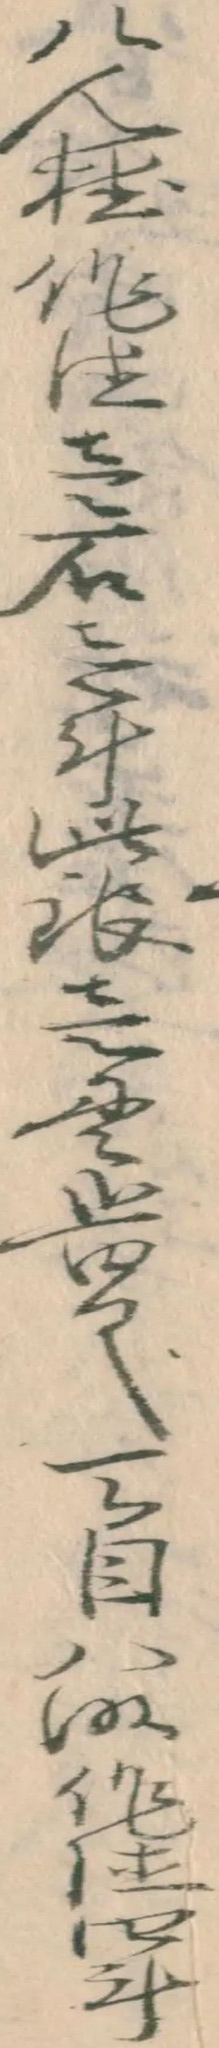八人植作法壱石壱斗此銀壱貫弐百匁百八拾八匁作植四斗
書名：賀茂社記録. 第66冊
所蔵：国立国会図書館 National Diet Library, JAPAN
